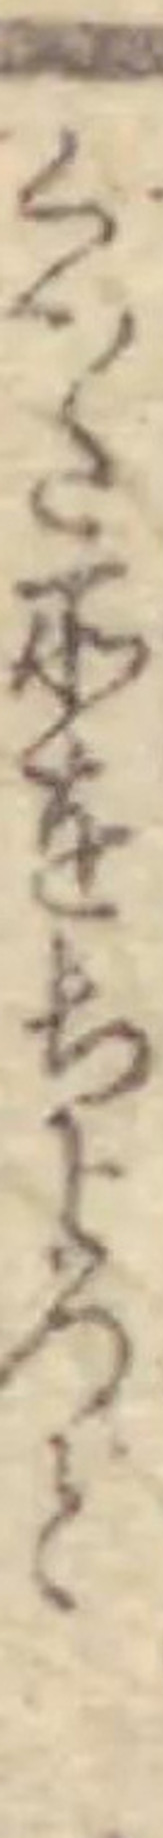くつた所をちよつと
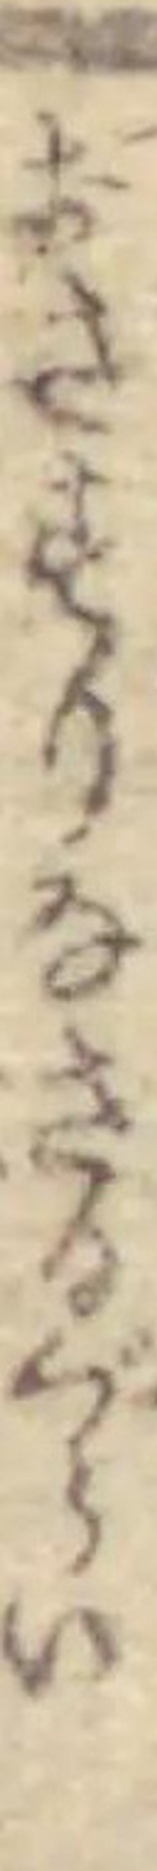おさすりなさるぐらい
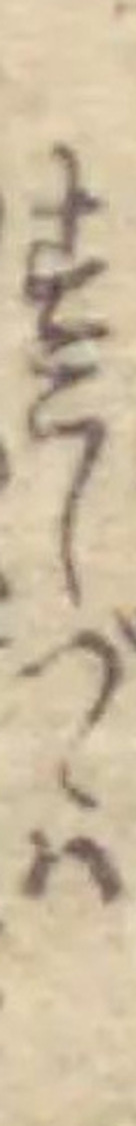すこしづゝは
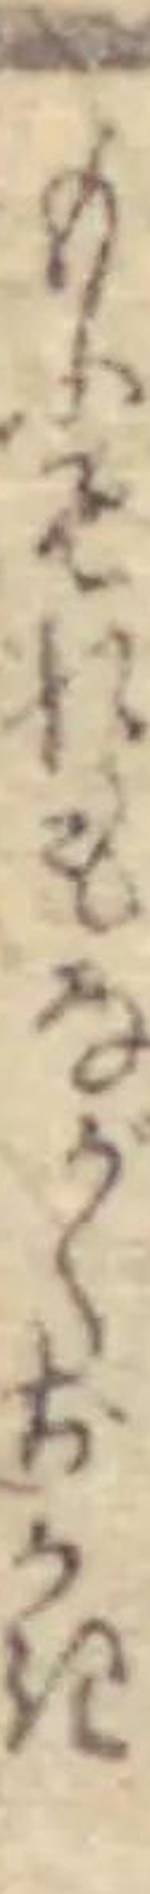もふそれもながくおかき
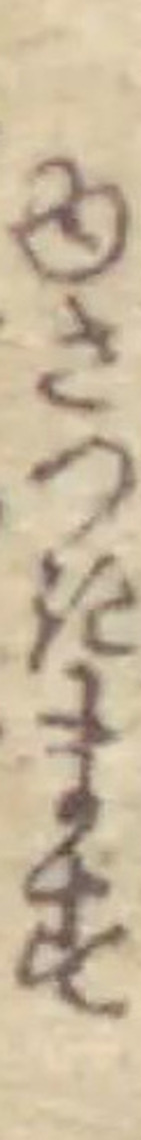ゆさつきます
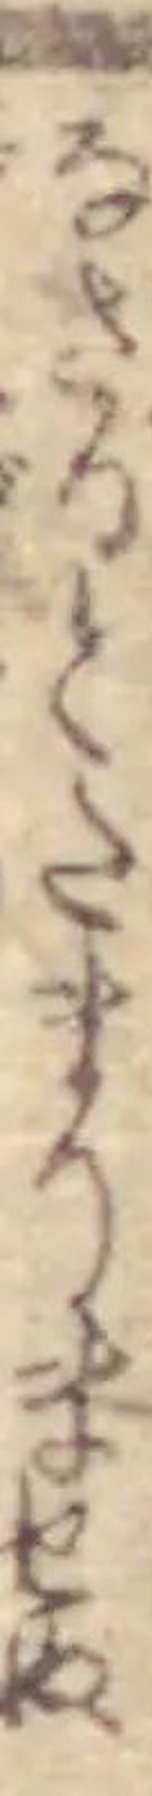なさるとたまりませぬ
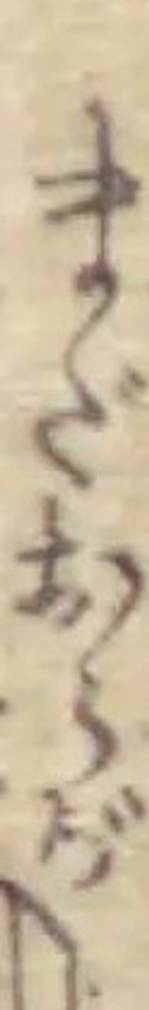まだおらが
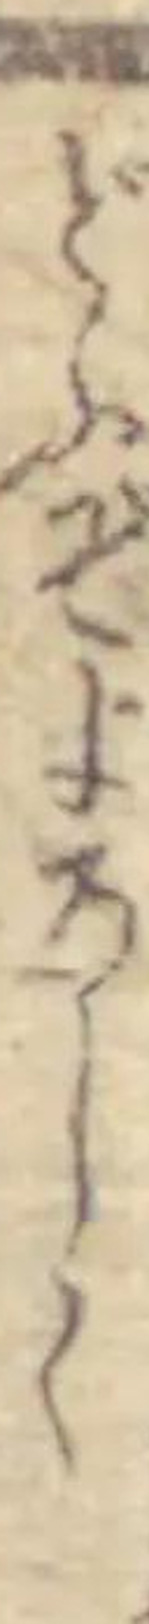どふぞよろしく
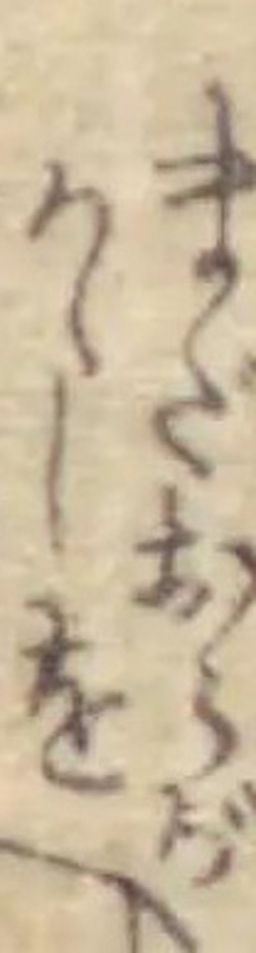かゝしを
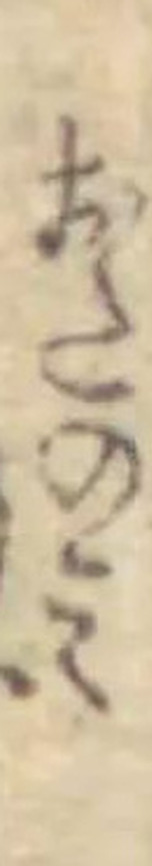おたのみ
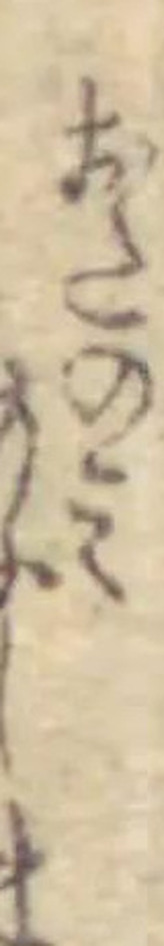おたのみ
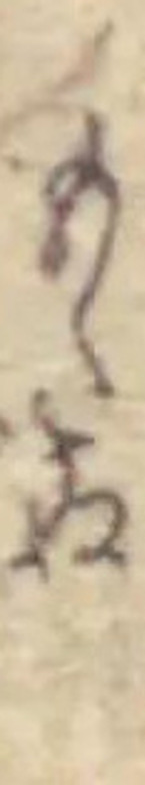もたぬ
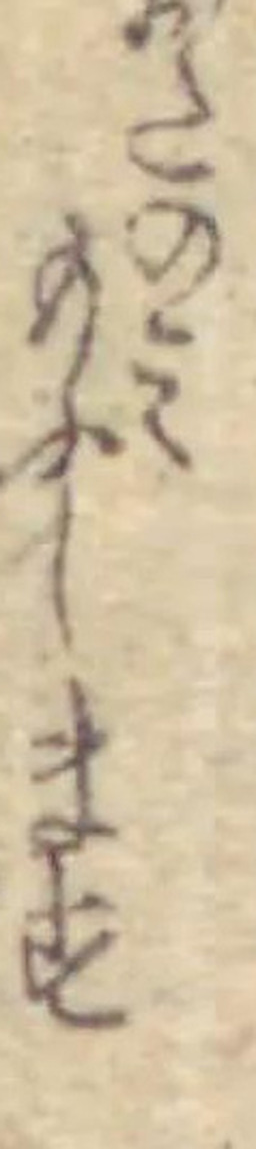もふします
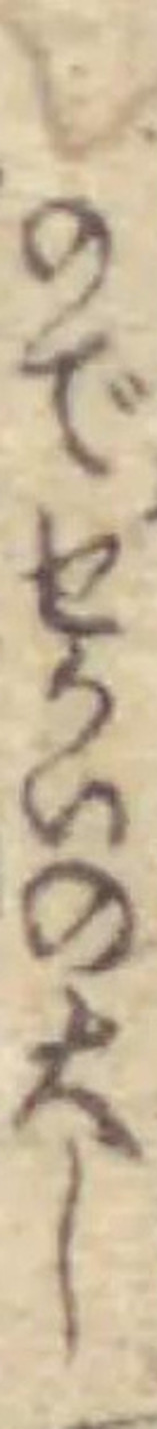のでせかいの大し
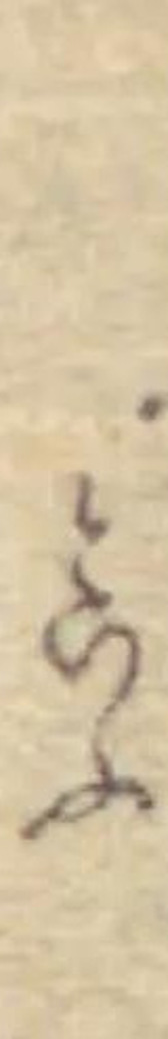といふ
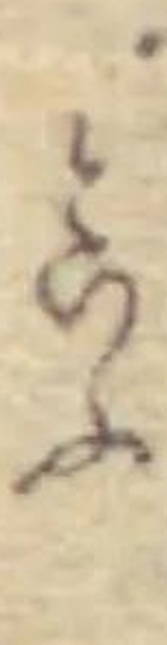といふ
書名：雨宮風宮出儘略縁記 3巻
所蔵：国立国会図書館 National Diet Library, JAPAN
